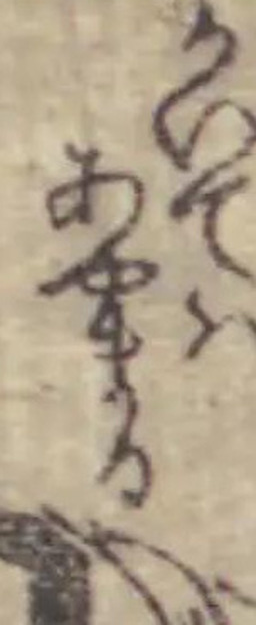あやまる
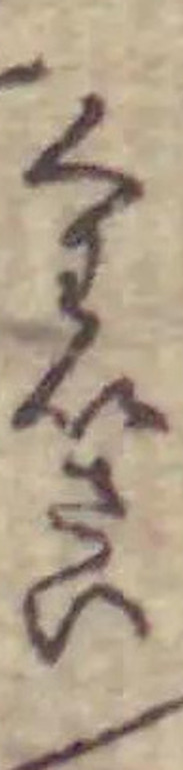くわいさい
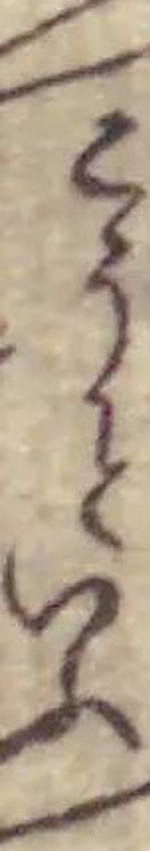こうといふ
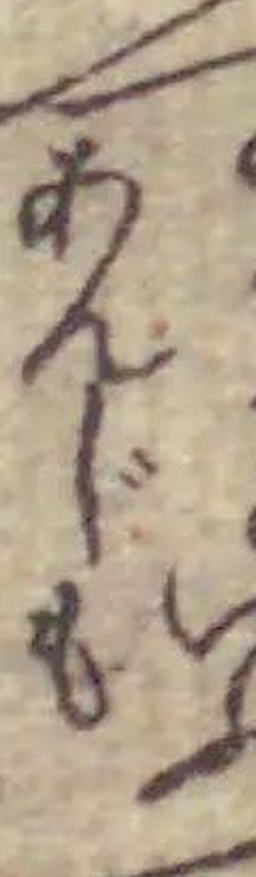あんじも
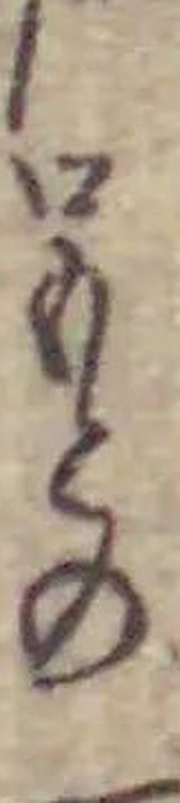口もとの
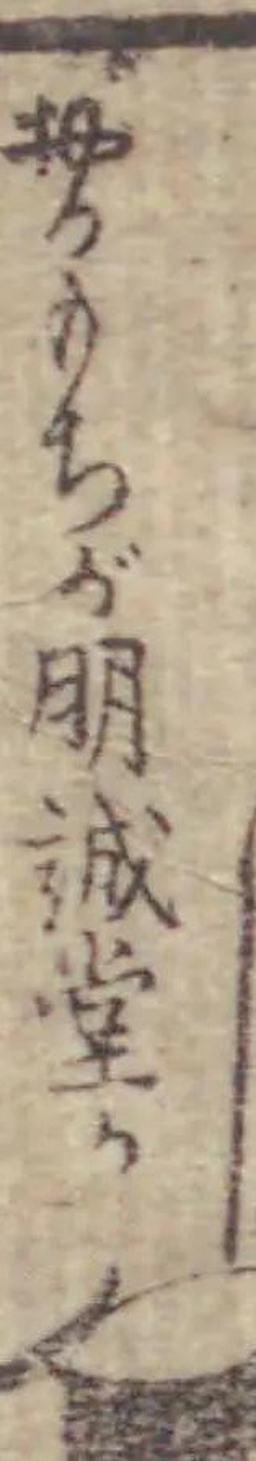おかもちが朋誠堂か
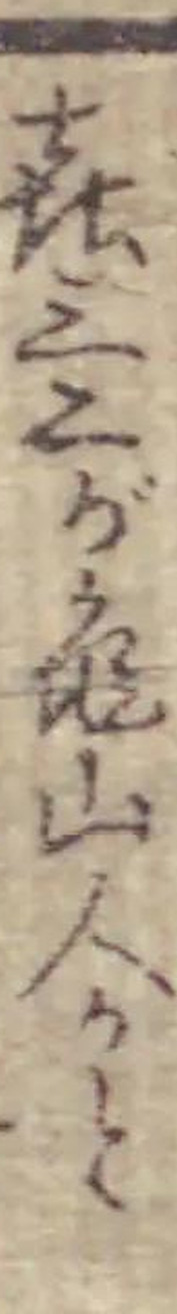喜三二が亀山人かと
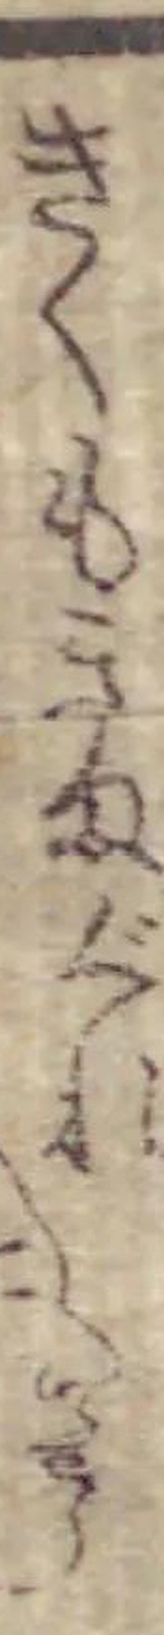きくもきまぐれ
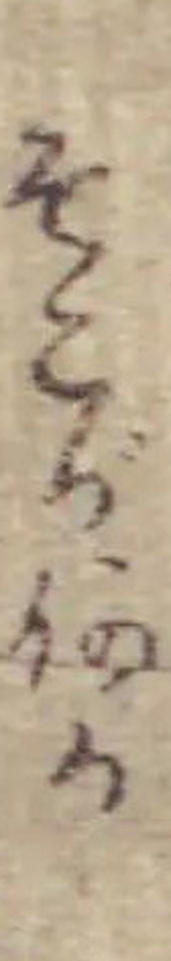そこが何か
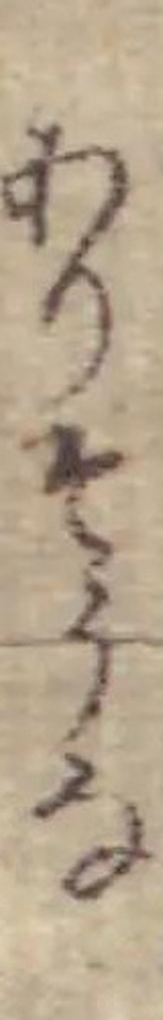ありそうな
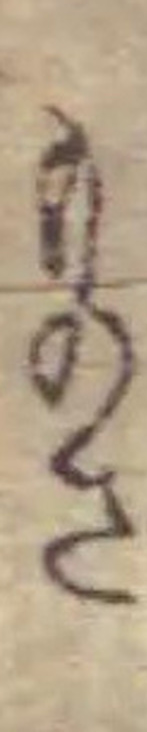ものさ

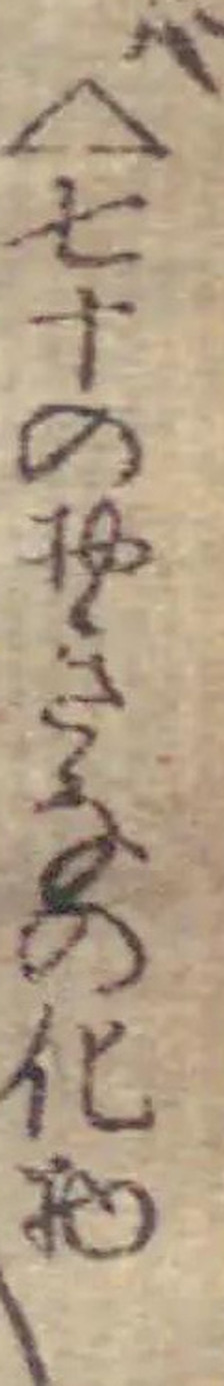△七十のおきなの化物
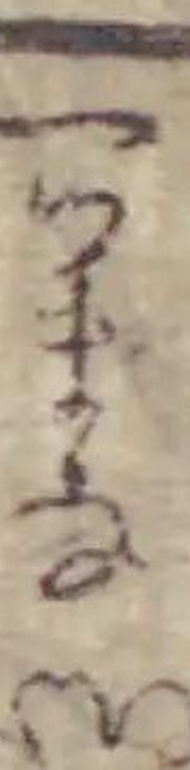一つまな
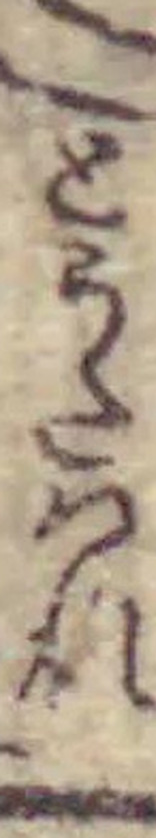とうたはれ
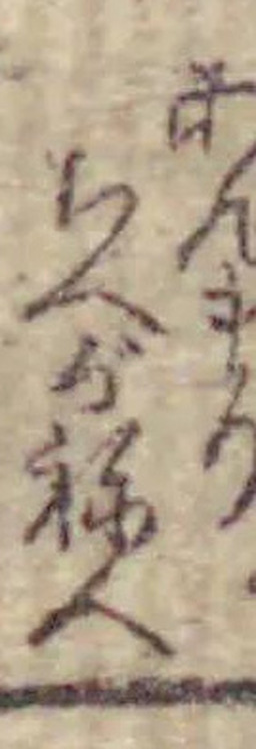ちへがねへ
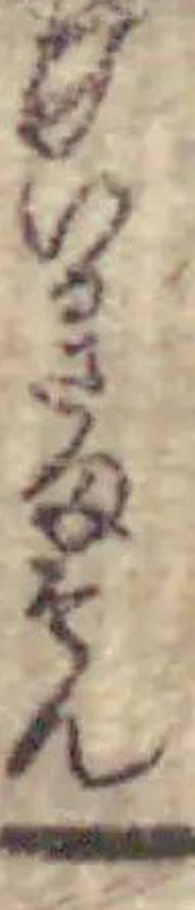いかさまそん
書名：亀山人家妖 3巻
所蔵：国立国会図書館 National Diet Library, JAPAN
